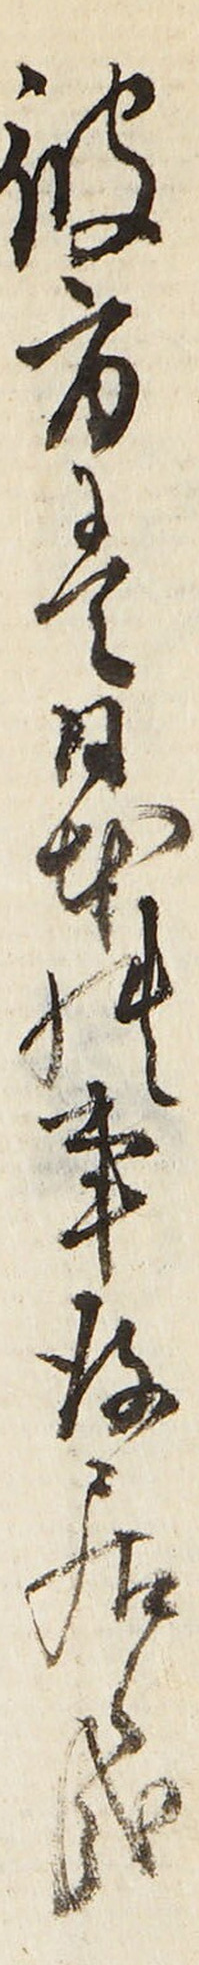彼方にて日本の事存居候哉
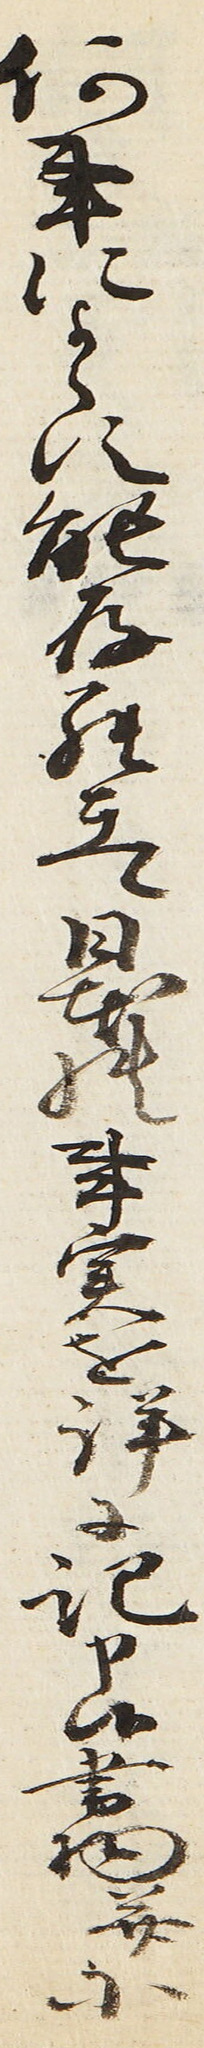何事によらす能存罷在候日本の事実を詳に記申候書物幷に
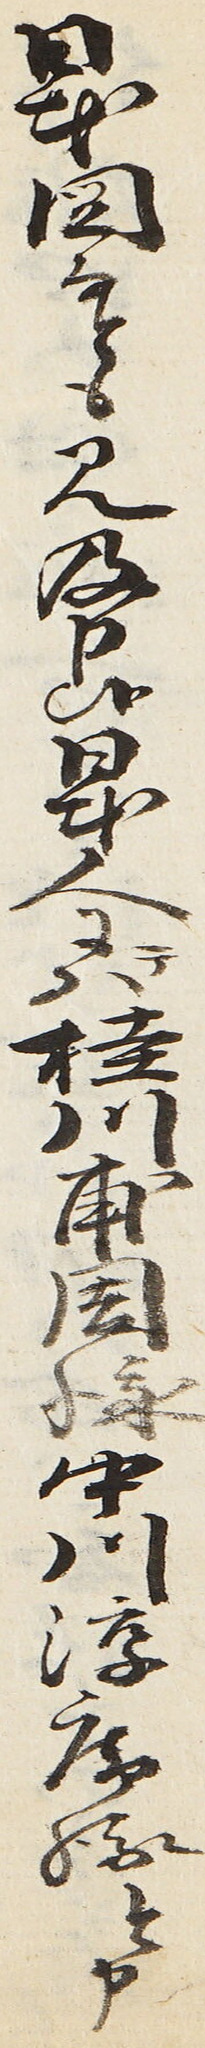日本図なとも見及申候日本人にては桂川甫周様中川淳庵様と申
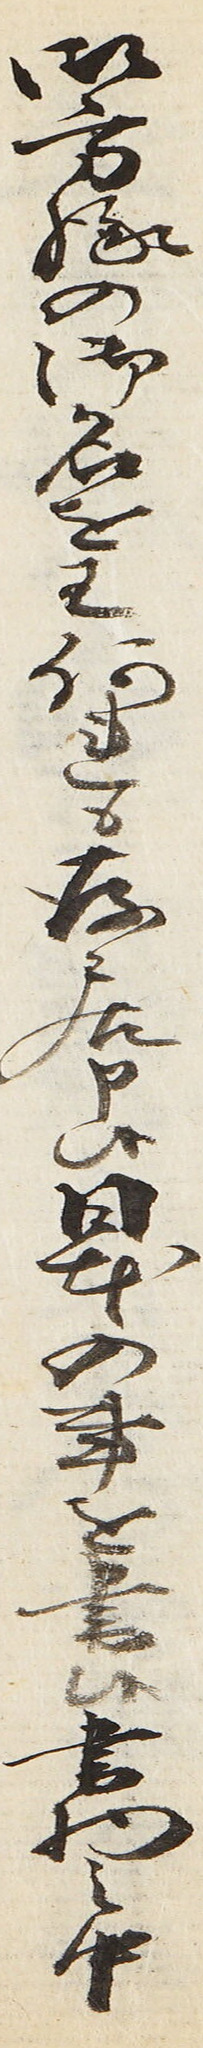御方様の御名をは何れも存居申候日本の事を書候書物之中
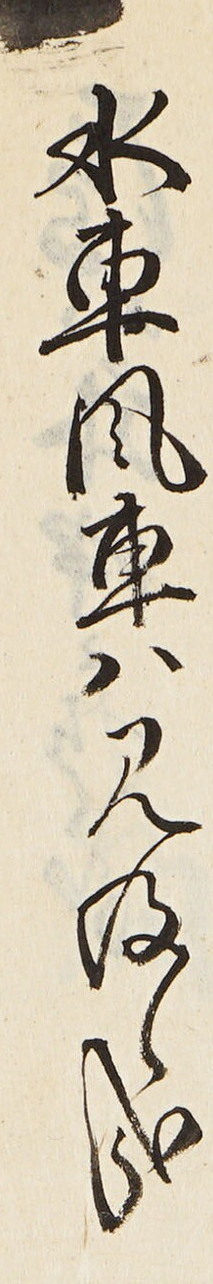水車風車は見及候哉
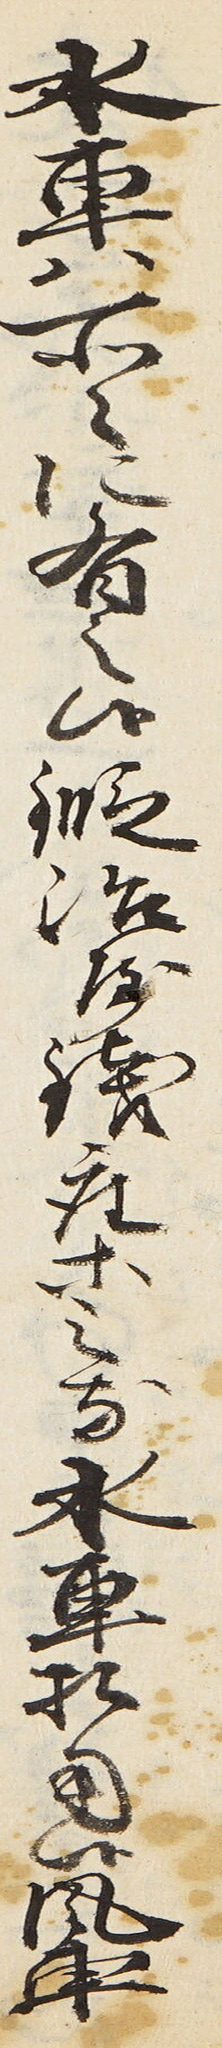水車は所々に有之候鍛冶屋銭座等みな水車相用候風車
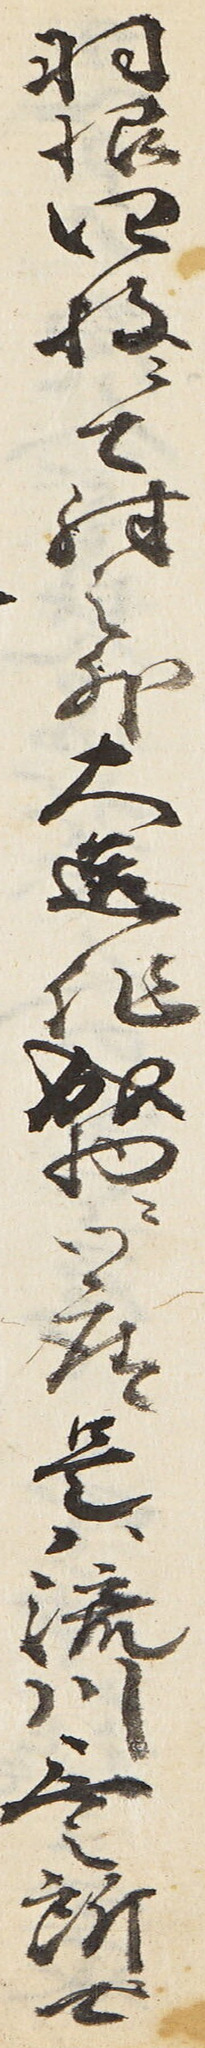羽根四枚にて殊之外大造作成物に御座候是は流川無之所にて
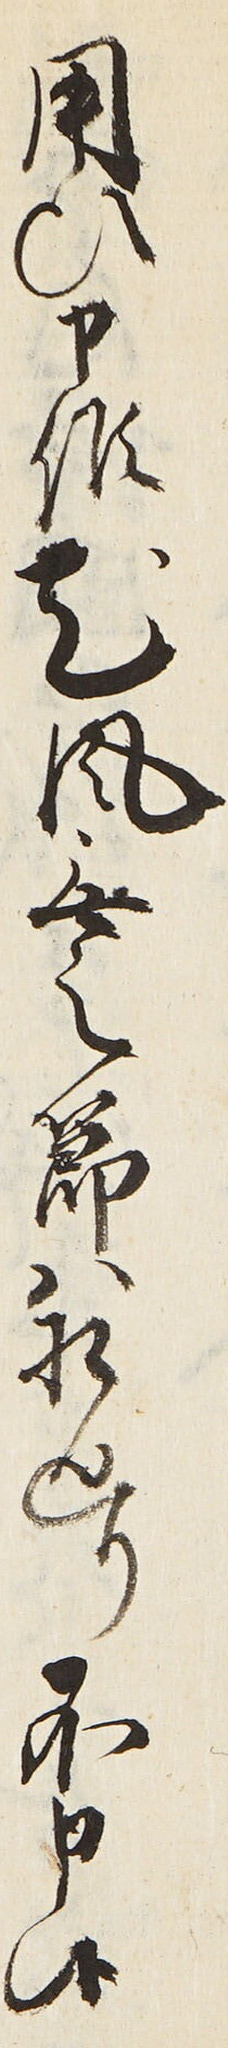用ひ申候尤風無之節は相廻り不申候
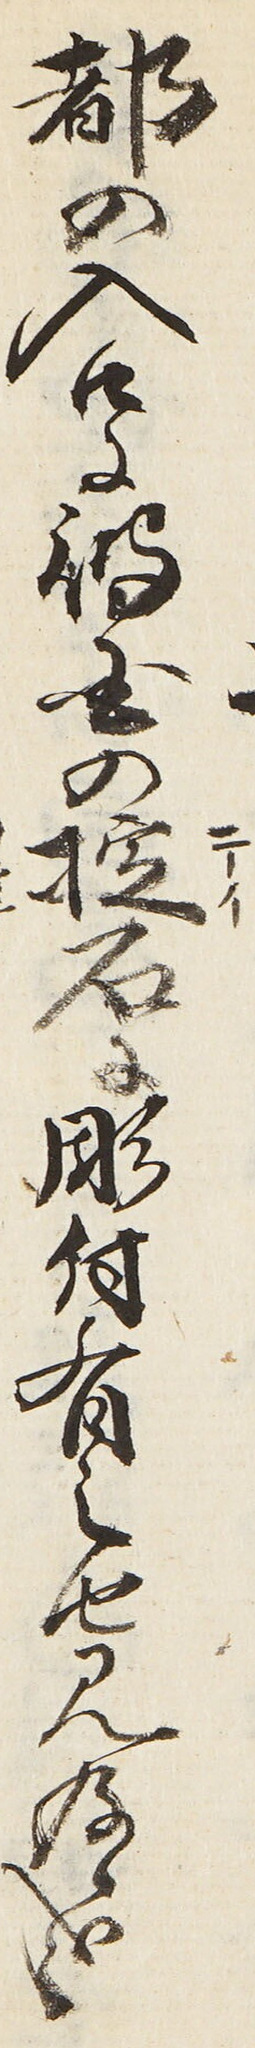都の入口に彼国の掟石に彫付有之由見及候哉
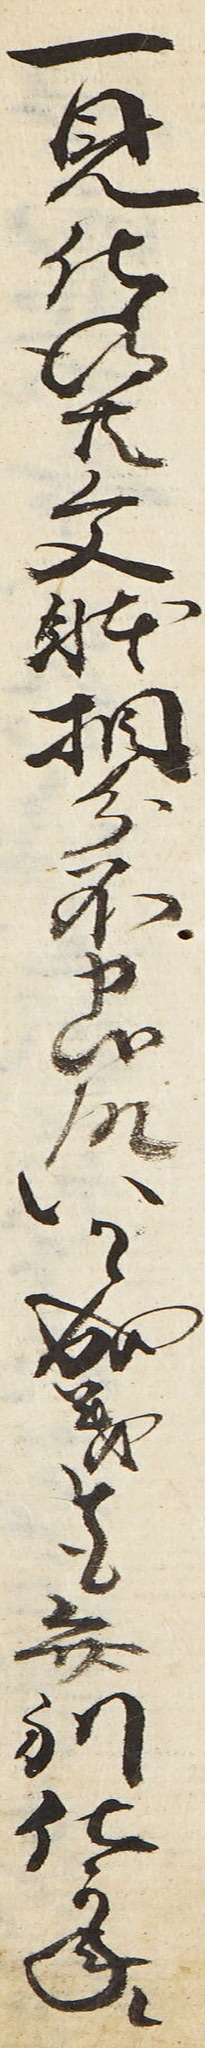一見仕候得共文躰相分不申候故いかゝ成義とも弁別仕かね候
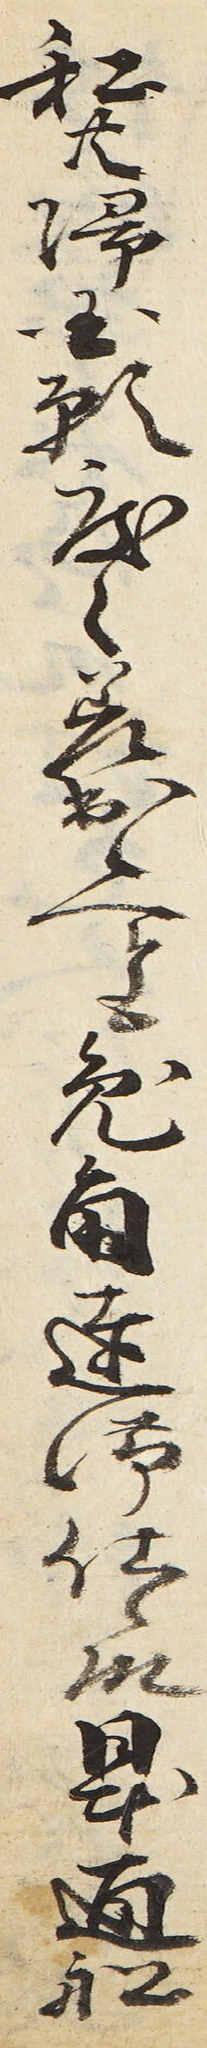私共帰国願度之差出候へとも兎角遅滞仕候故日本通船

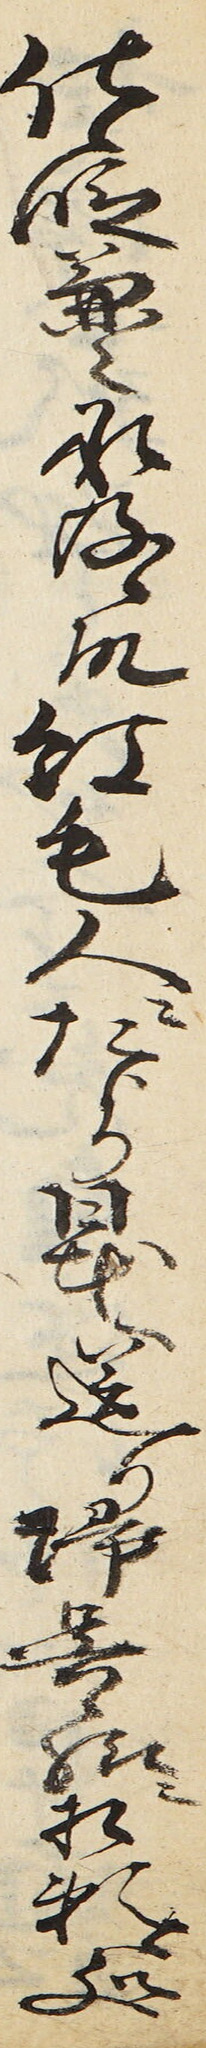仕候段兼々承及候故紅毛人にたより日本へ送り帰呉候様に相願候処
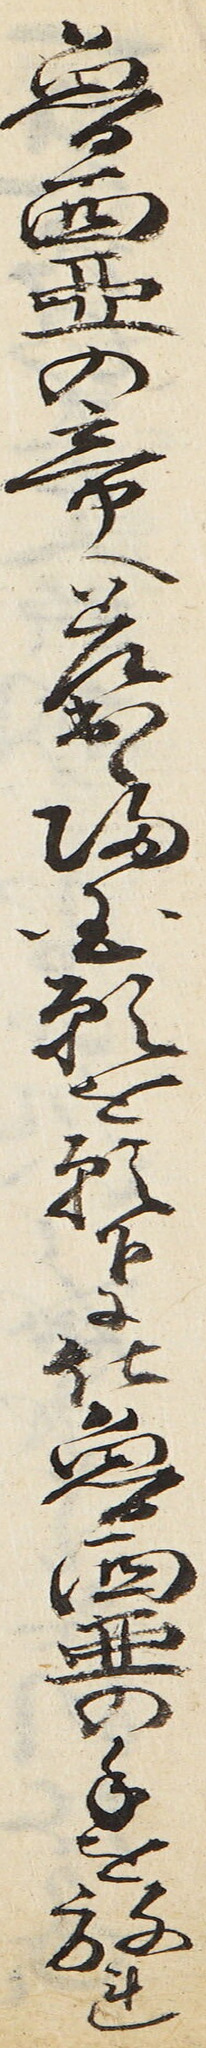魯西亜の帝へ差出候帰国願を願下に仕魯西亜の手を放れ
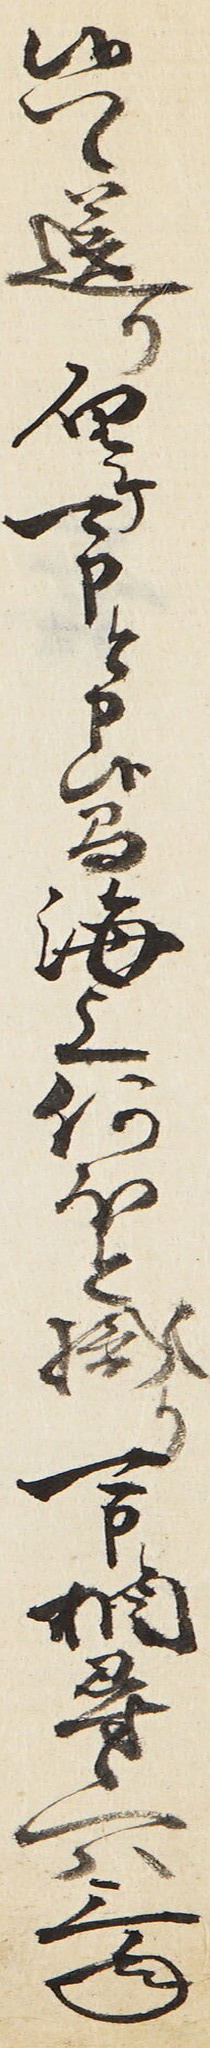候はゝ送り届け可申と申候間海上何ほと掛り可申相尋候へは三年
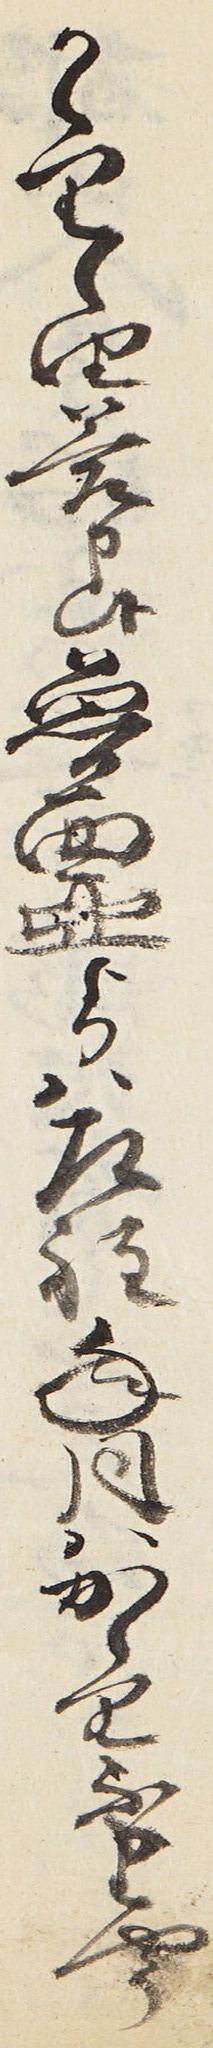かゝり候由答申候魯西亜よりは左程年月はかゝり不申候やう
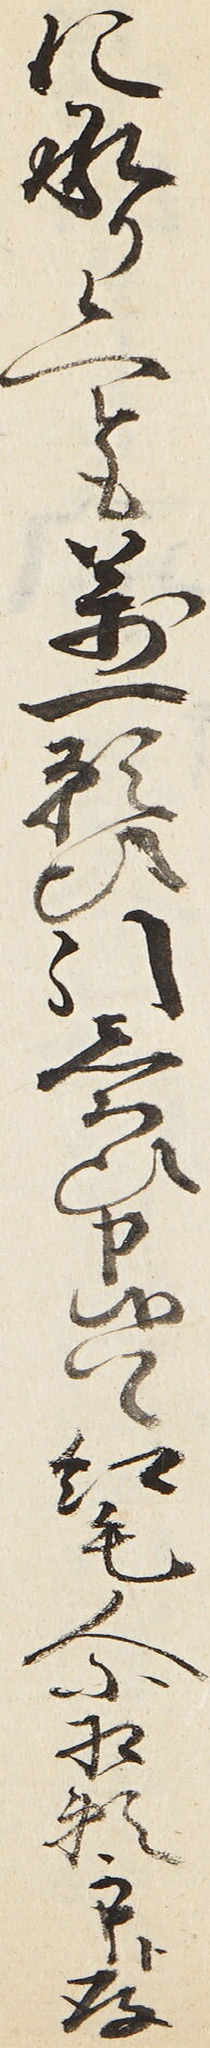に承り候へとも万一願ひ引しかひ申候はゝ紅毛人に相頼可申と存
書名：漂民御覧之記
